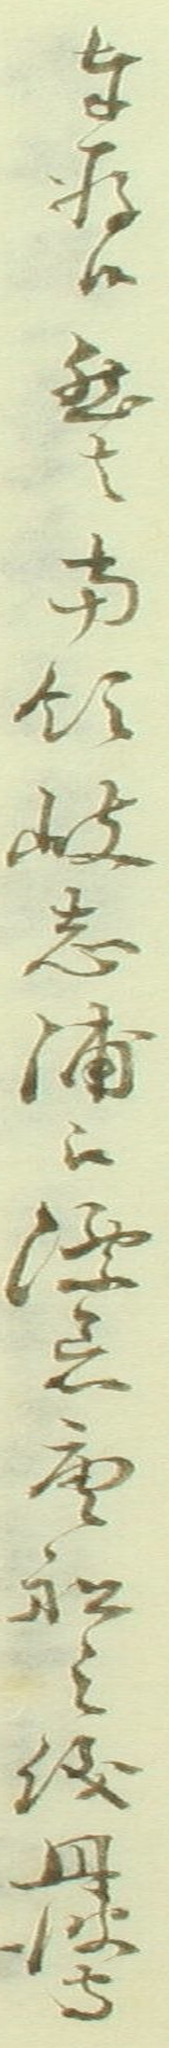奉存候然者当領岐志浦え漂着唐船之儀丹波守
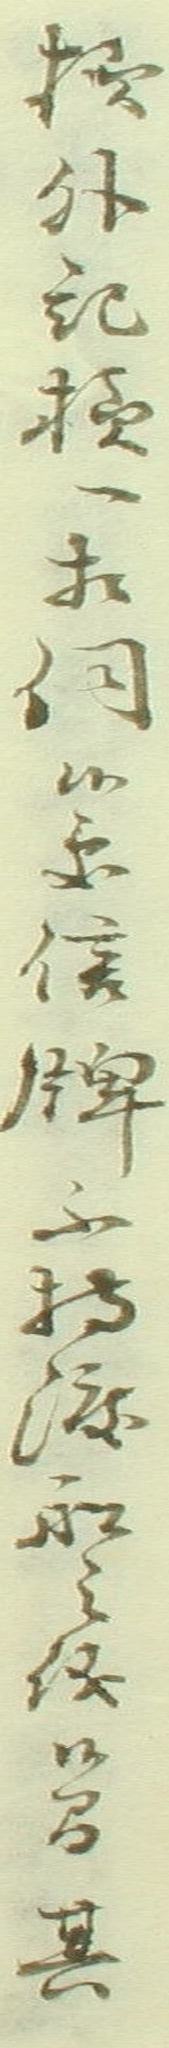様外記様へ相伺候処信牌不持渡船之儀候間其
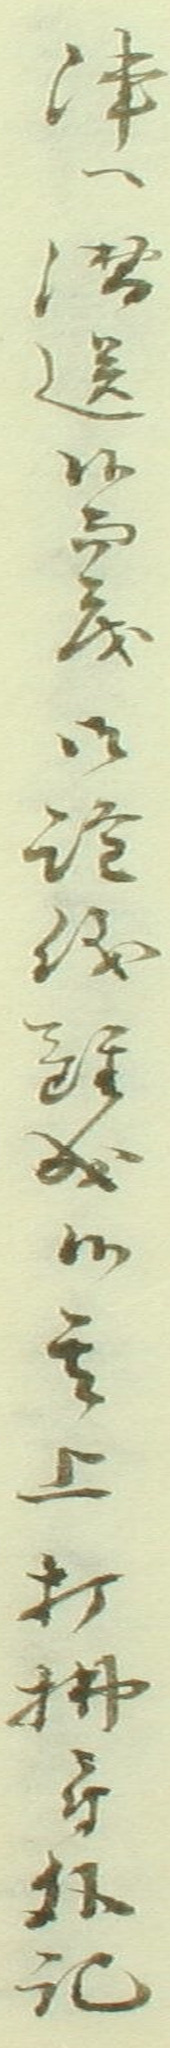津へ漕送候而茂御詮議難成候其上打払に付外記
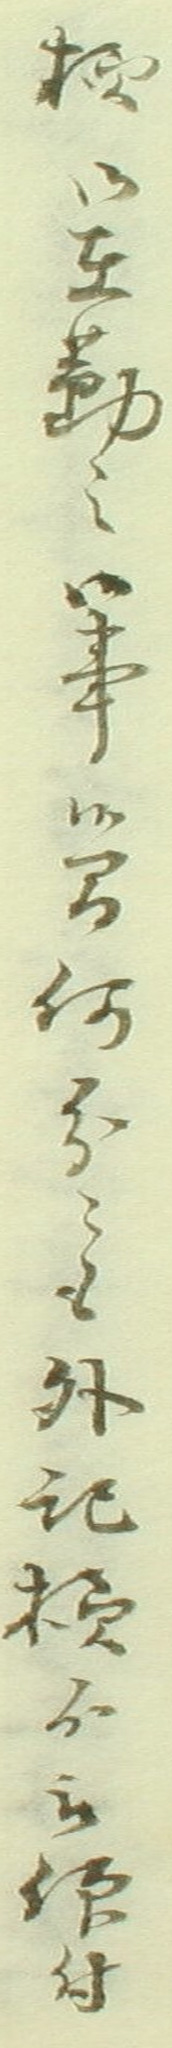様御在勤之御事候間何分にも外記様ゟ被仰付
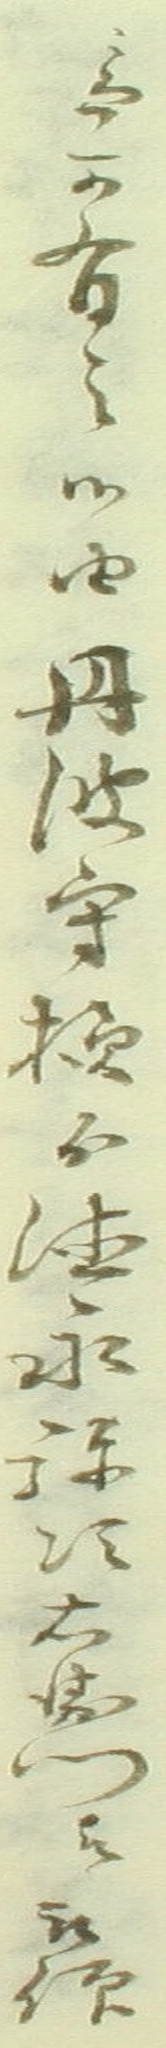に而可有之候由丹波守ゟ徳永弥次右衛門え被仰
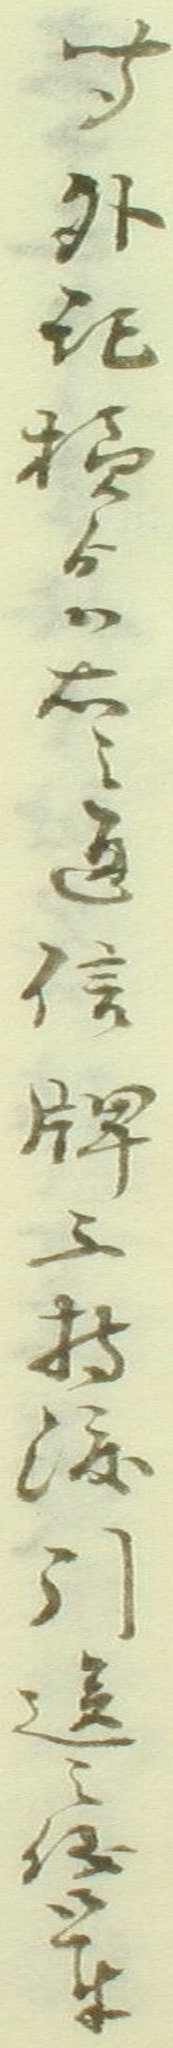聞外記様ゟ御右之通信牌不持渡引送之儀御奉
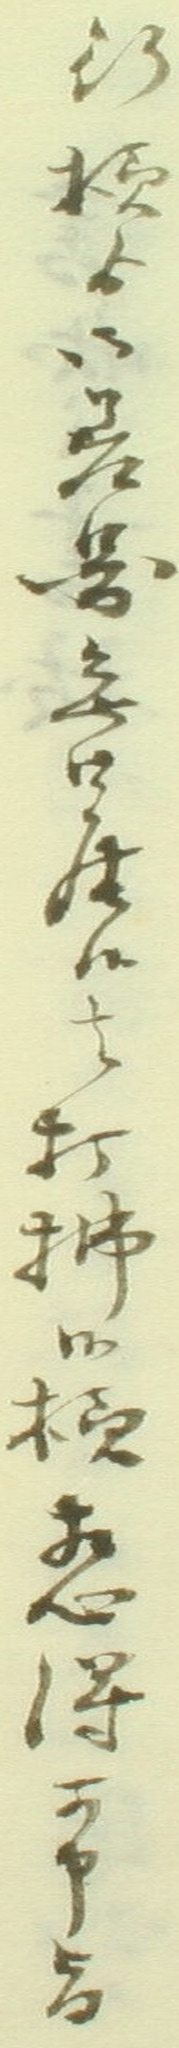行様ゟ御差図無御座候者打払候様相心得可申旨
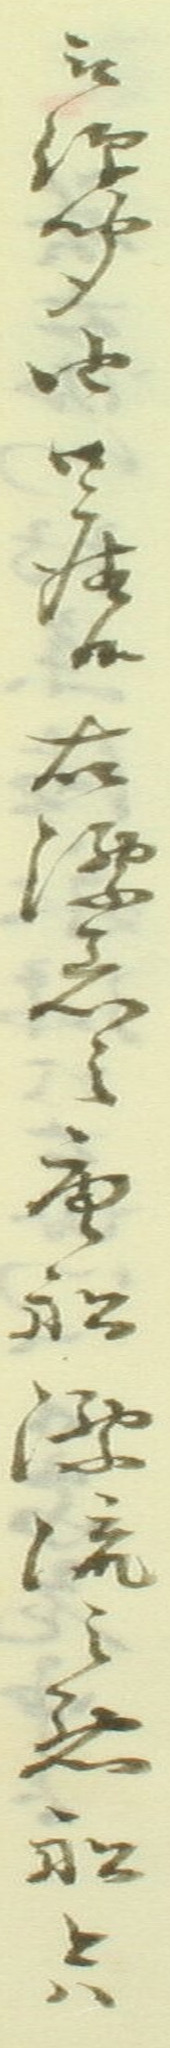被仰聞由御座候右漂着之唐船漂流之悪船とは
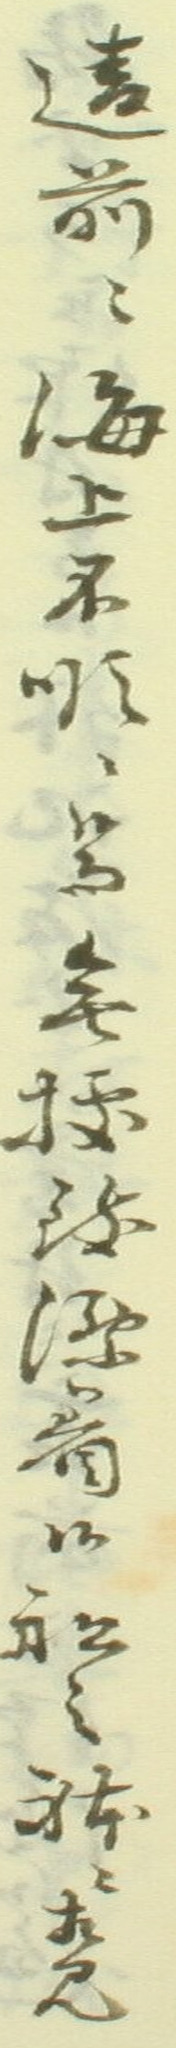違前々海上不順に候而無拠致漂着候船之躰に相見
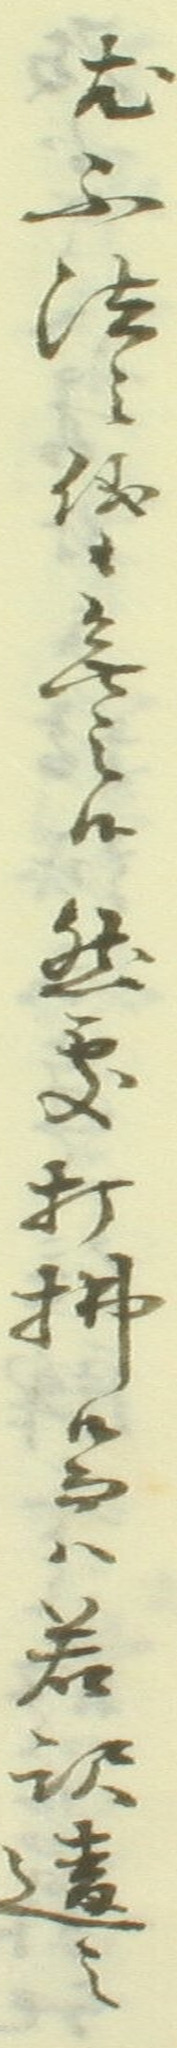尤不法之儀に無之候然処打払候而は若訳違之
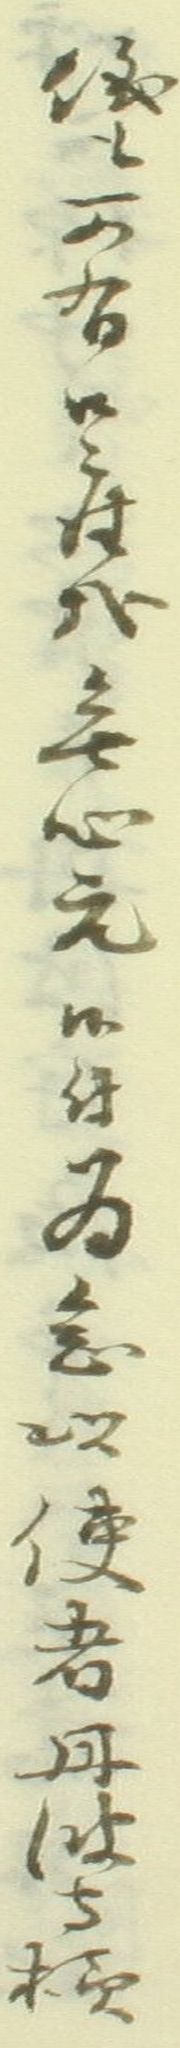儀も可有御座哉無心元候付為急以使者丹波守様
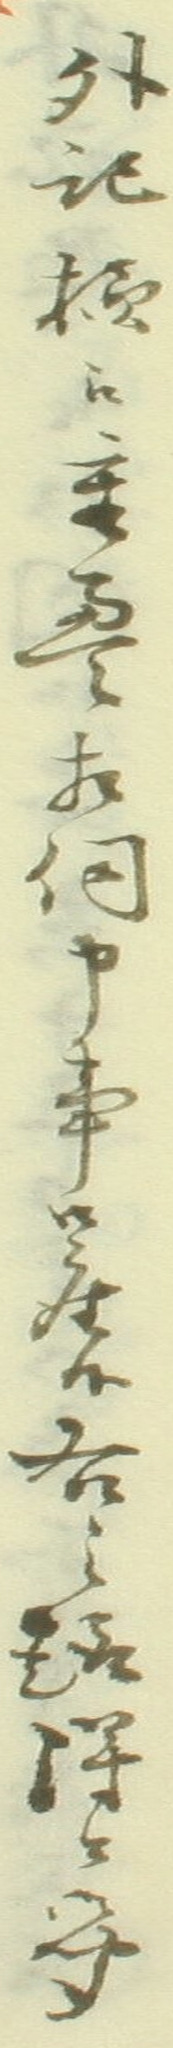外記様え重畳相伺申事御座候各之趣得と御聞
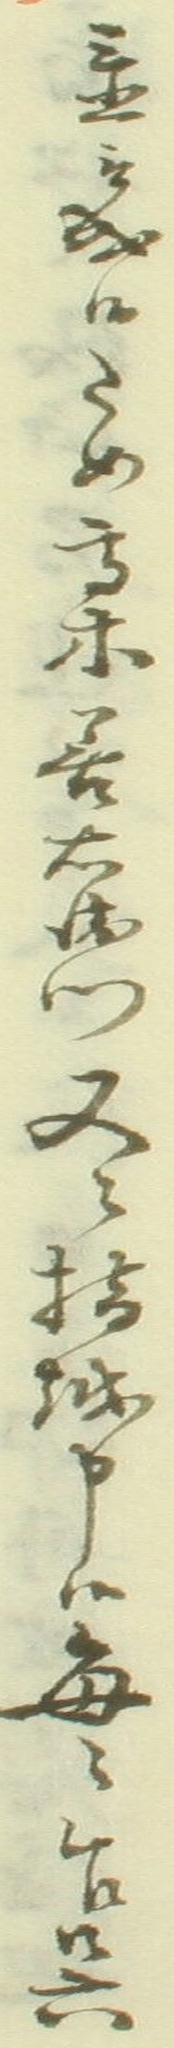置被成候ため高木善右衛門又々指越申候毎々乍御六
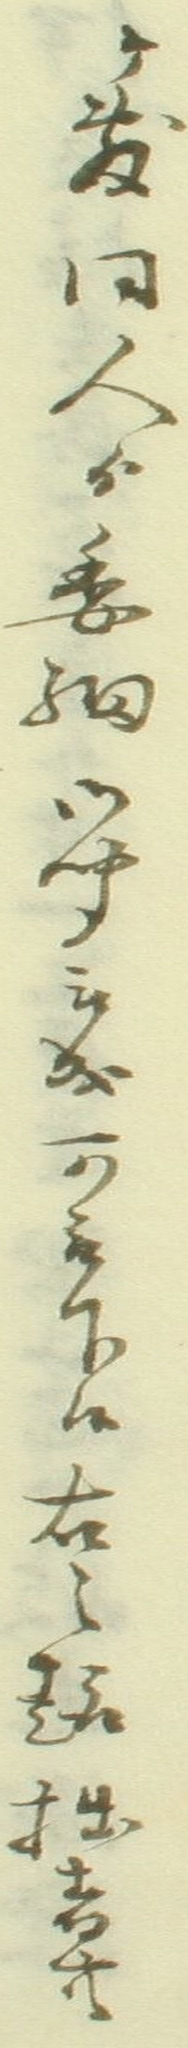ヶ敷同人ゟ委細御聞被成可取下候右之趣拙者共
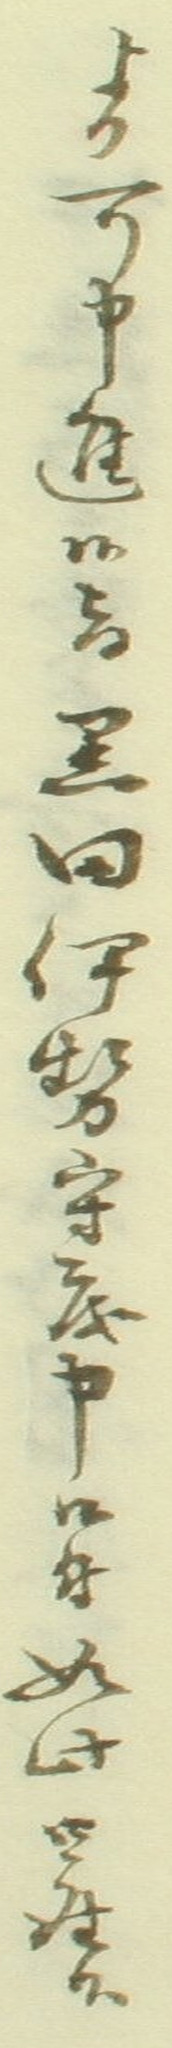より可申進候旨黒田伊勢守茂申候付如此御座候
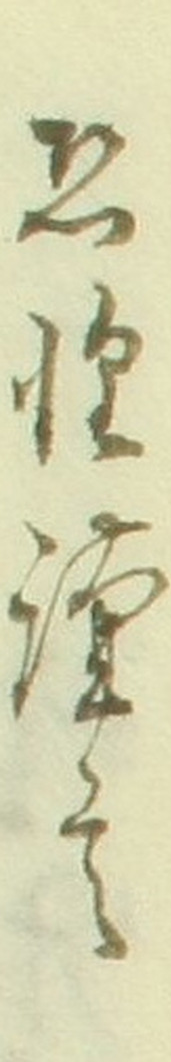恐惶謹言
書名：異国船漂着記
